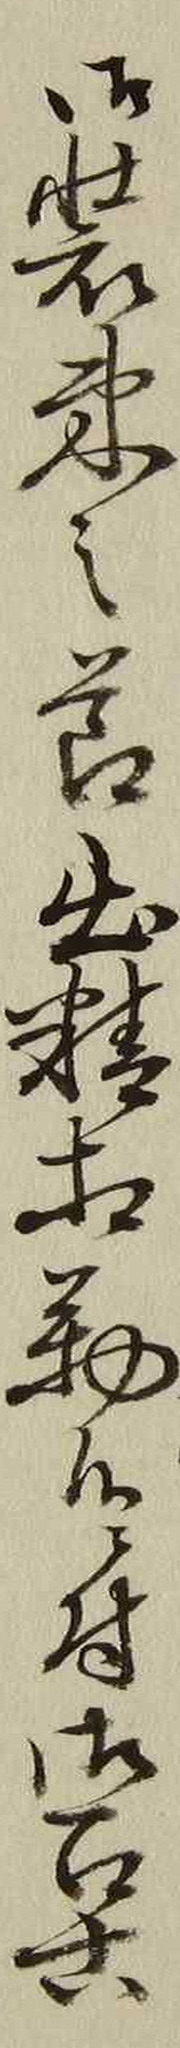御装束之節出精相勤候ニ付御召古
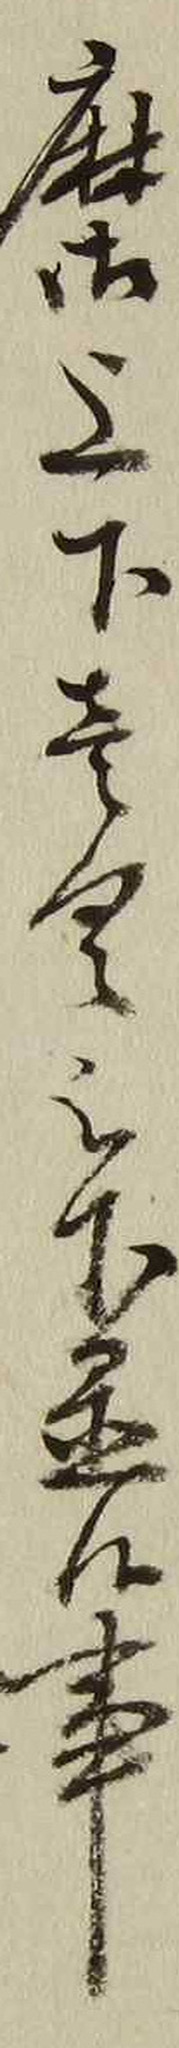麻御上下壱具被下置候事
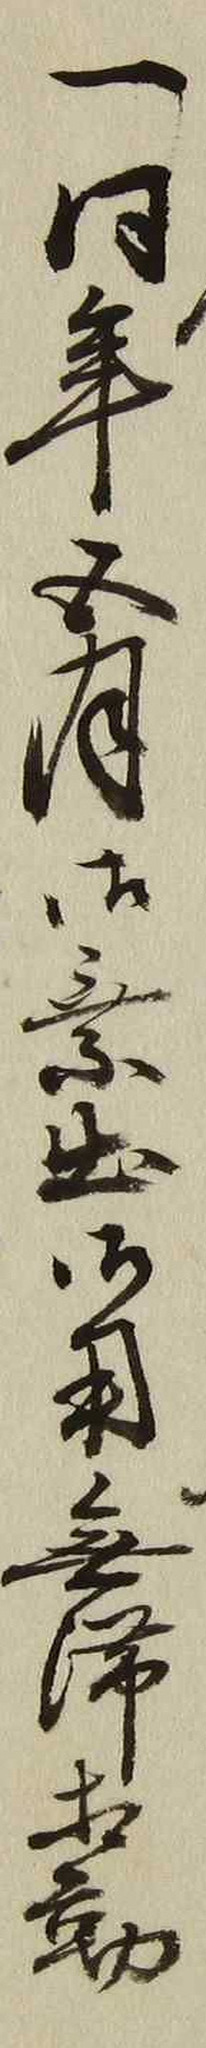一同年五月御乗出御用無滞相勤
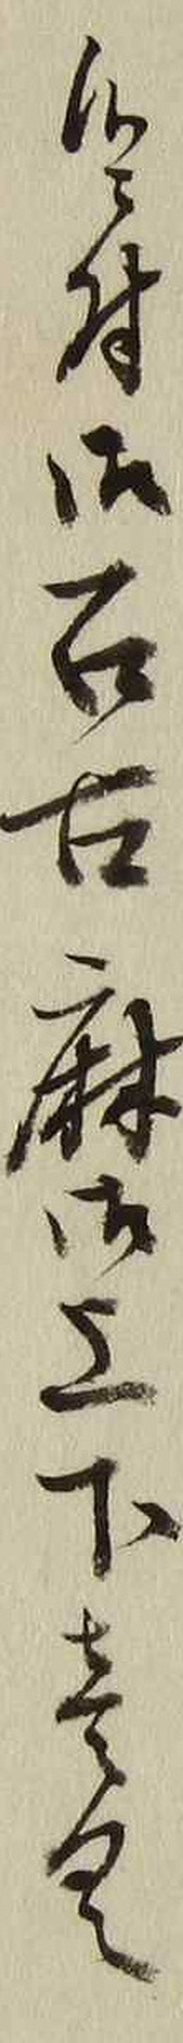候ニ付御召古麻御上下壱具
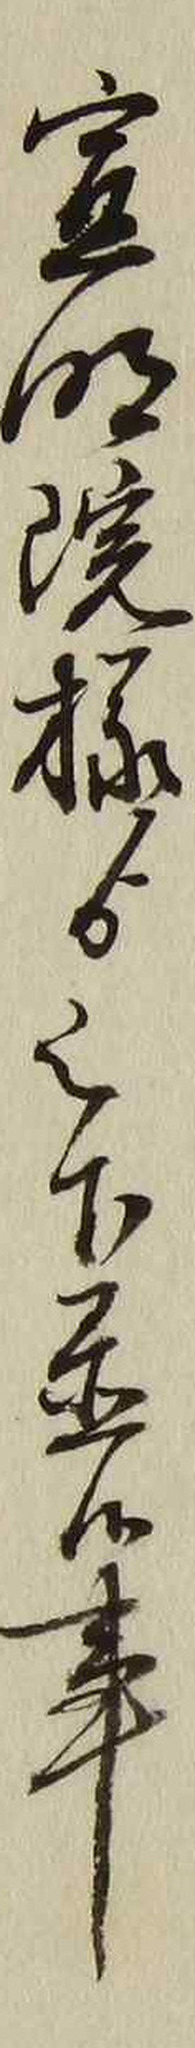宣明院様ゟ被下置候事
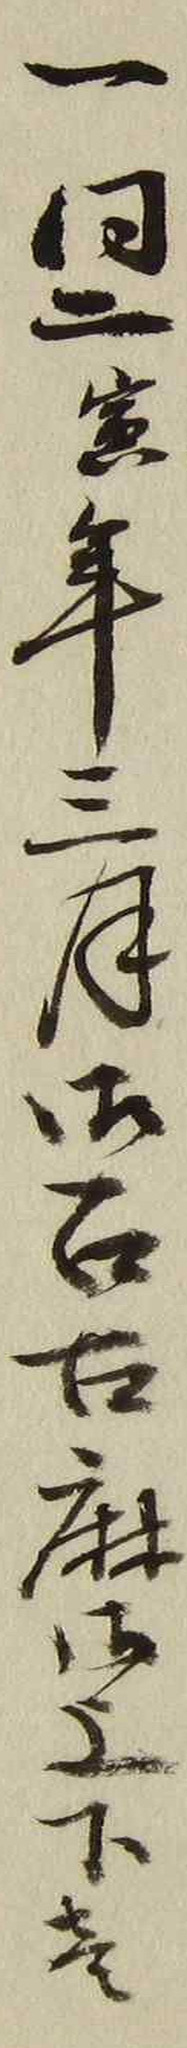一同二寅年三月御召古麻御上下壱
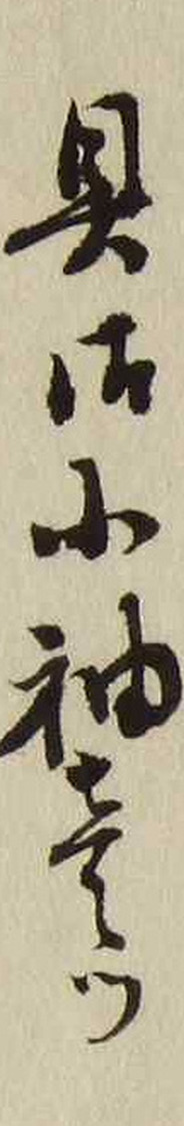具御小袖壱ツ
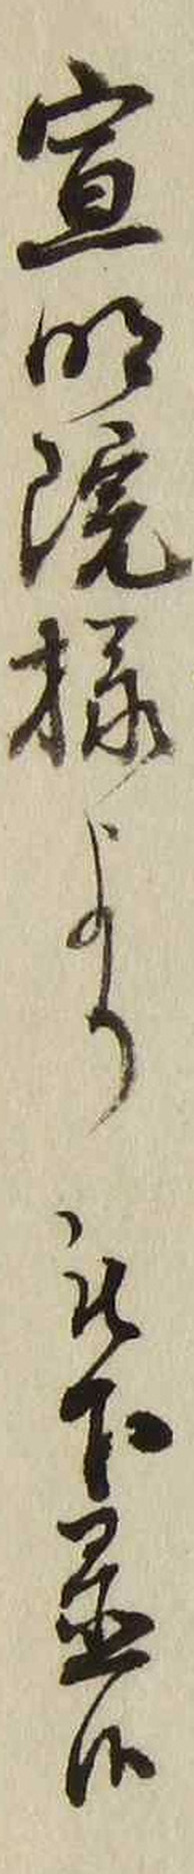宣明院様より被下置候

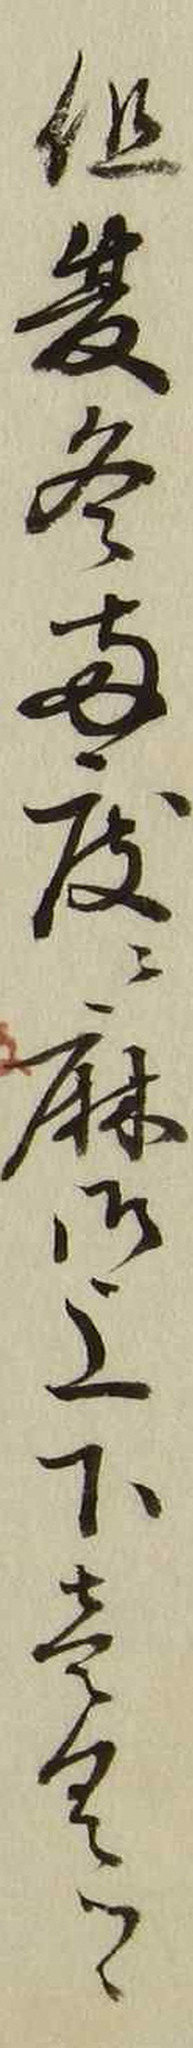但夏冬両度ニ麻御上下壱具ツヽ
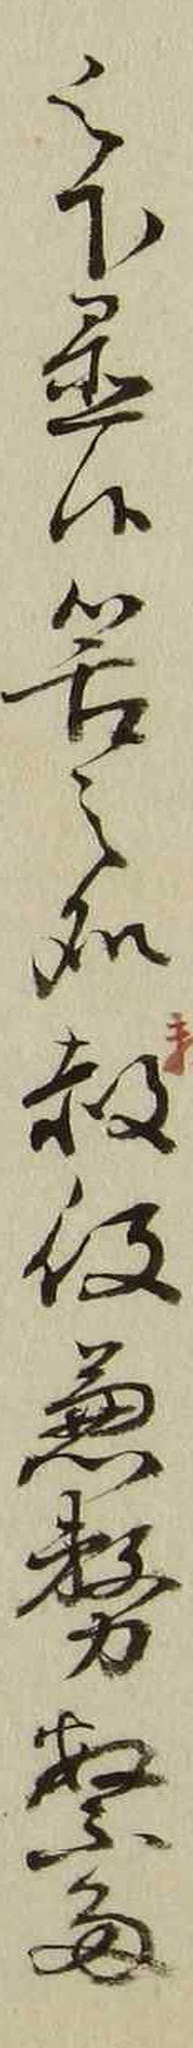被下置候筈之処赦役兼務繁多
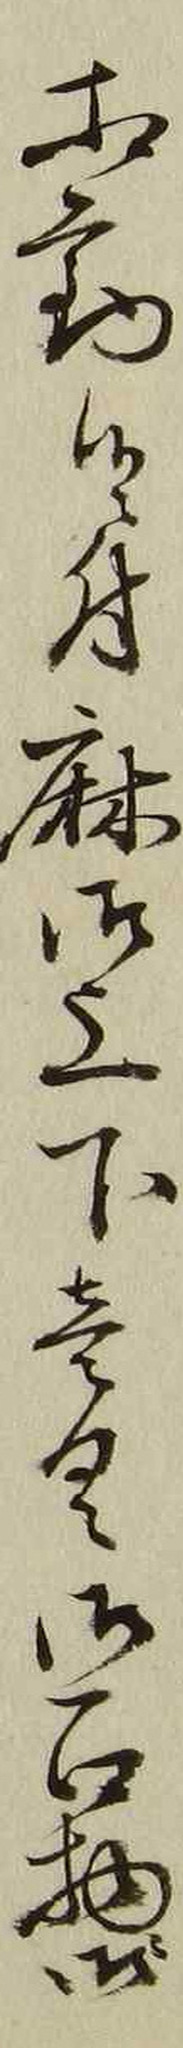相勤候ニ付麻御上下壱具御召物ニ御
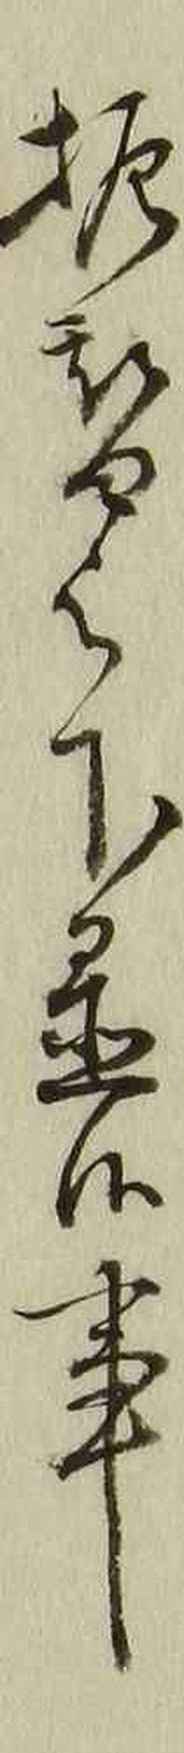振替被下置候事
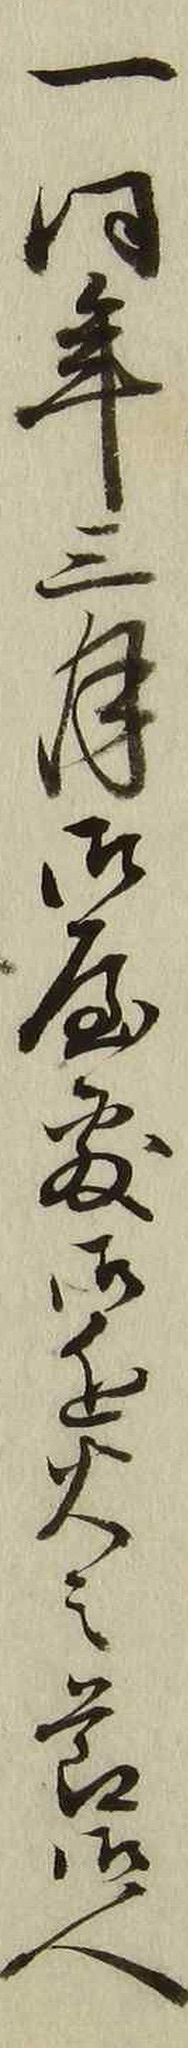一同年三月御屋敷御近火之節御人
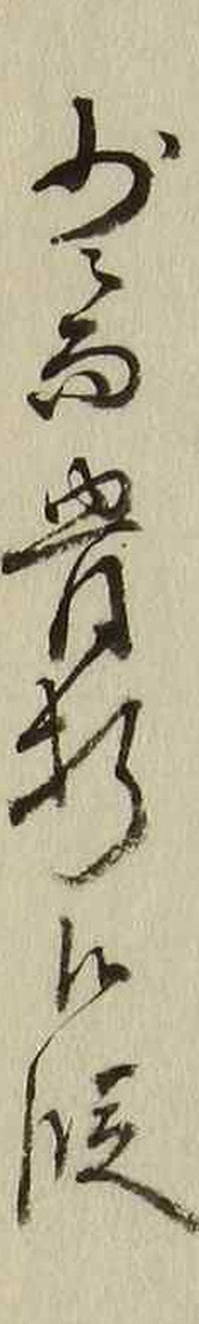少ニ而骨折候段
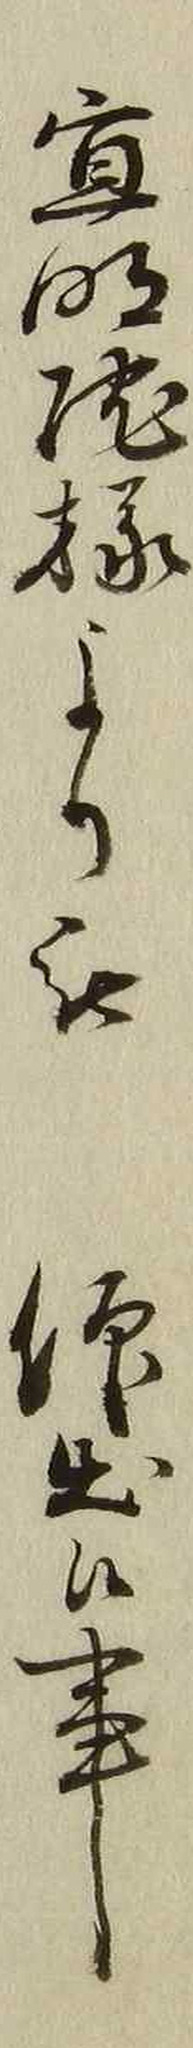宣明院様より被仰出候事
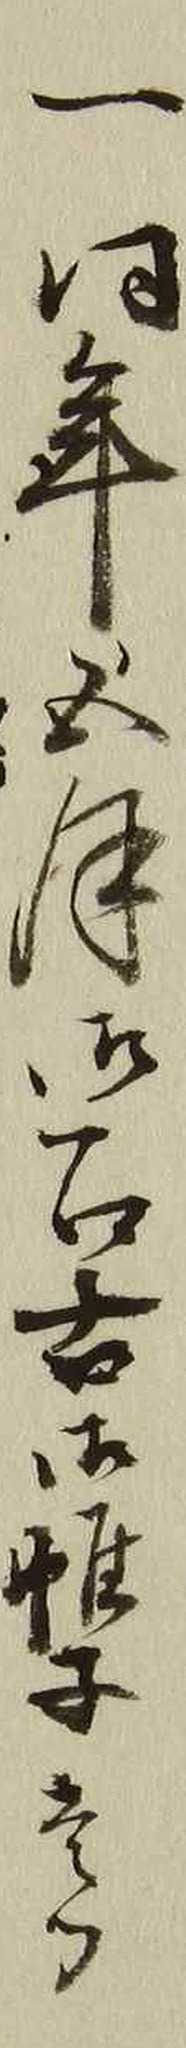一同年五月御召古御帷子壱ツ
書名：諸士系譜　巻之35　は之部3
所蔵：会津若松市立会津図書館
